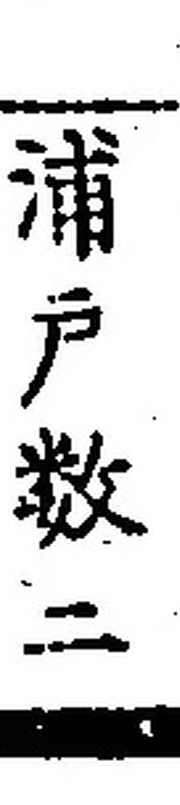浦戸数二
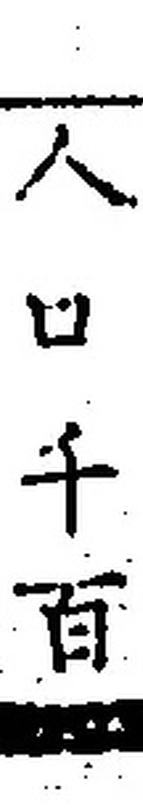人口千百
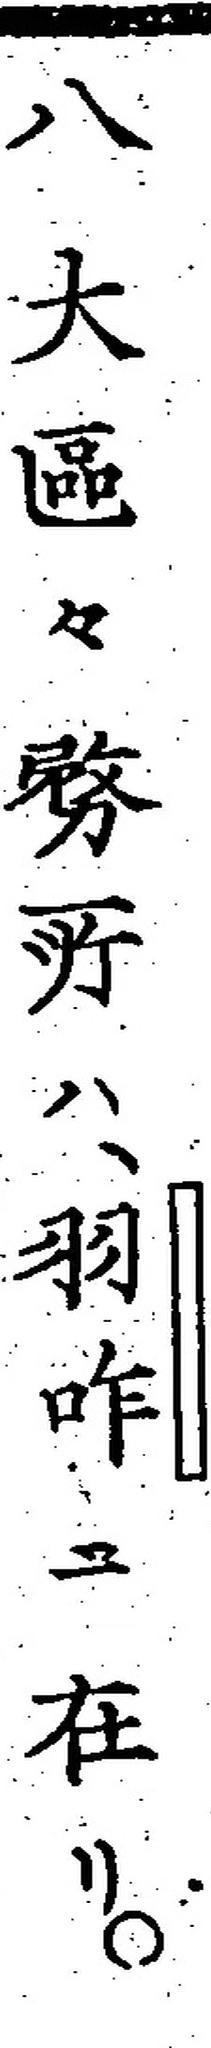八大区々務所ハ、羽咋ニ在リ。
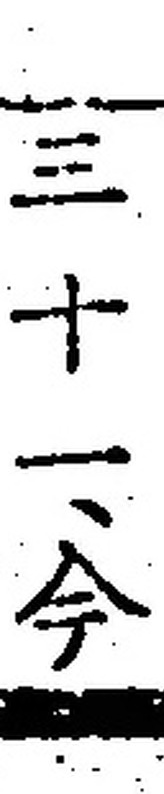三十一、今
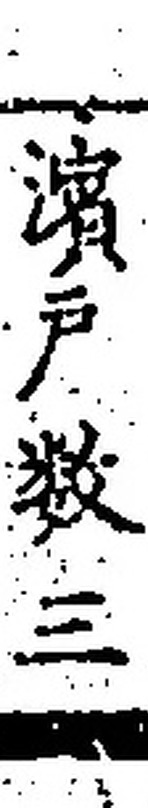浜戸数三
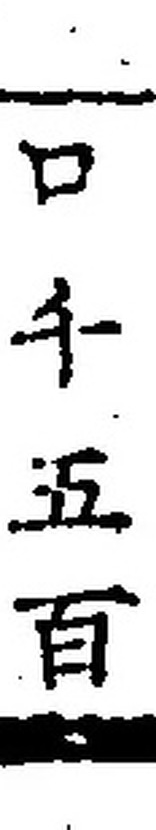口千五百
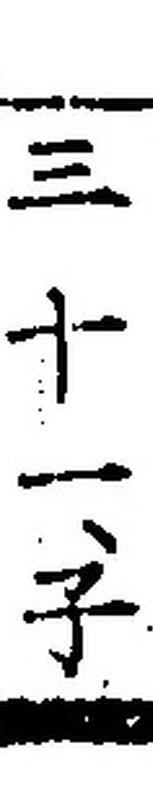三十一、子
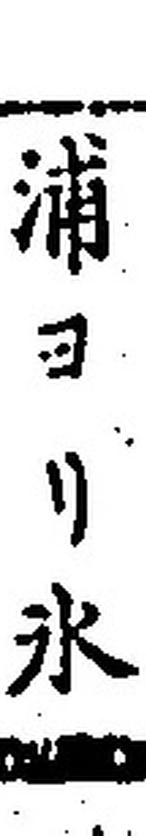浦ヨリ氷
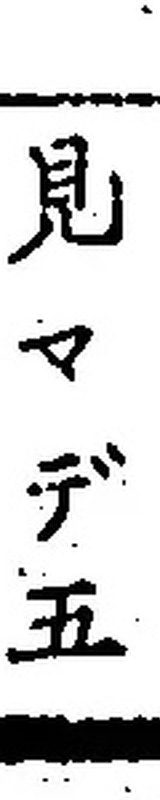見マデ五
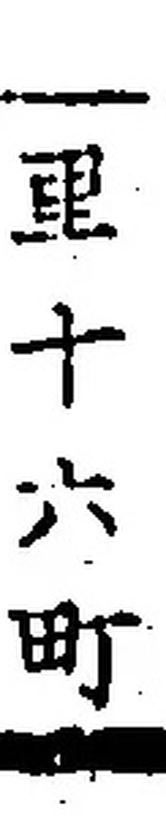里十六町
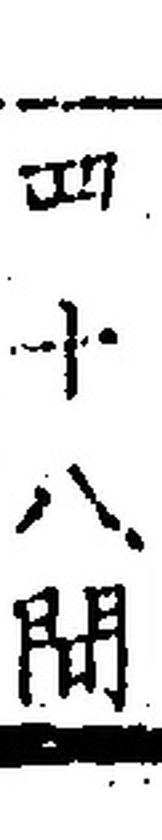四十八間
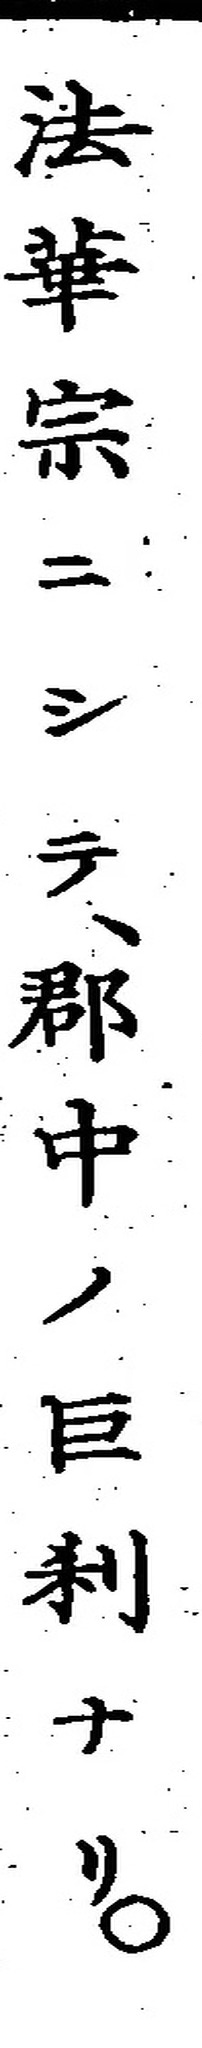法華宗ニシテ、郡中ノ巨刹ナリ。
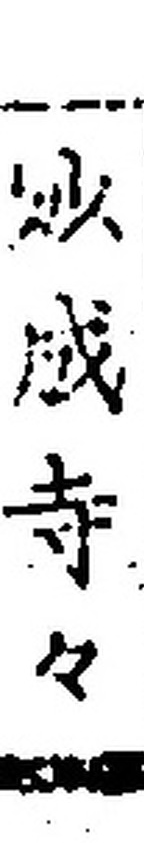妙成寺々
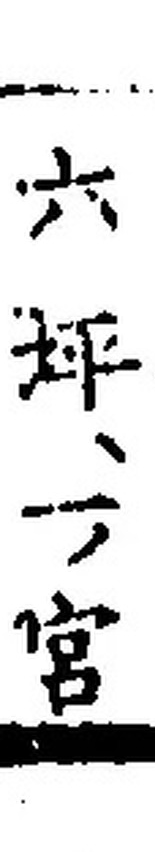六坪、一宮
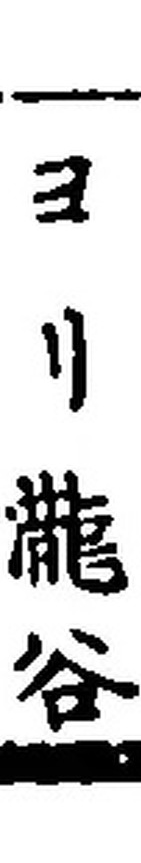ヨリ滝谷
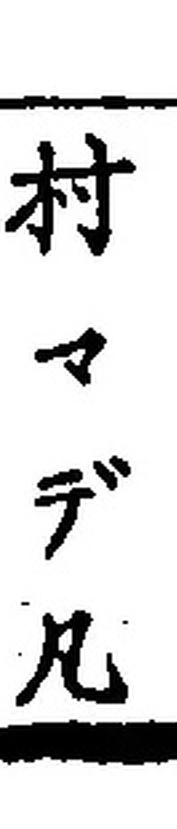村マデ凡
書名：能登地誌略
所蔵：国立国会図書館 National Diet Library, JAPAN
